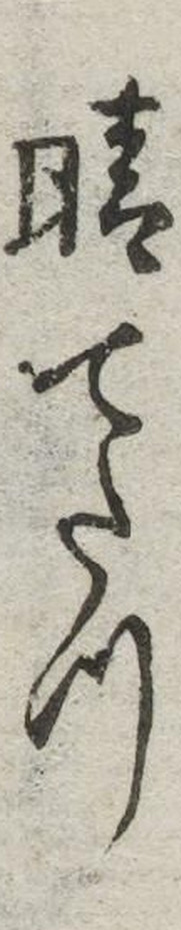晴てたつ
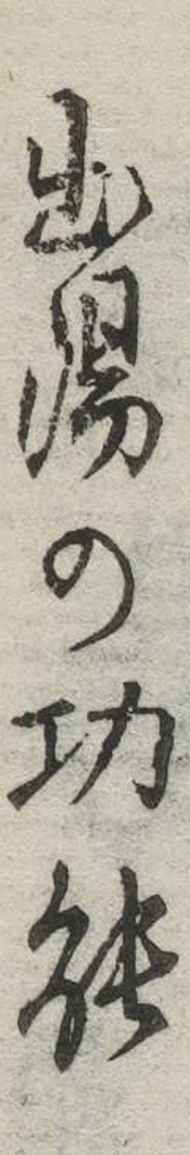出湯の功能

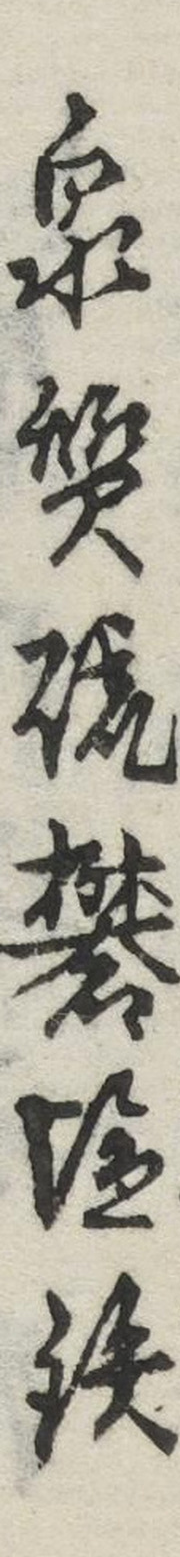泉質硫礬塩鉄
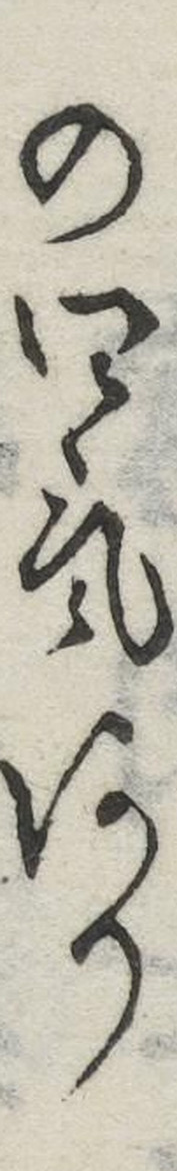の四気あり
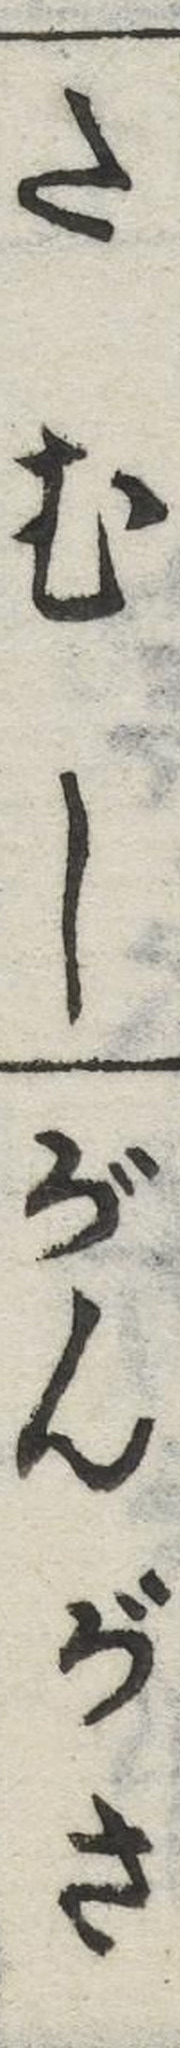たむしがんがさ
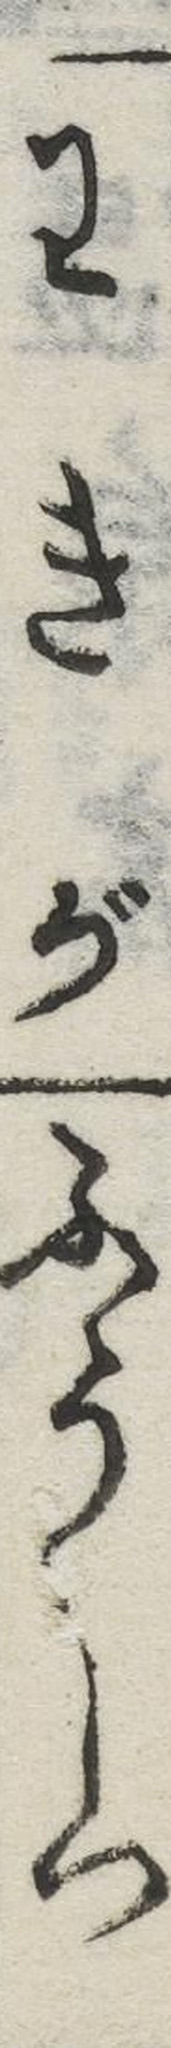わきがふうしつ
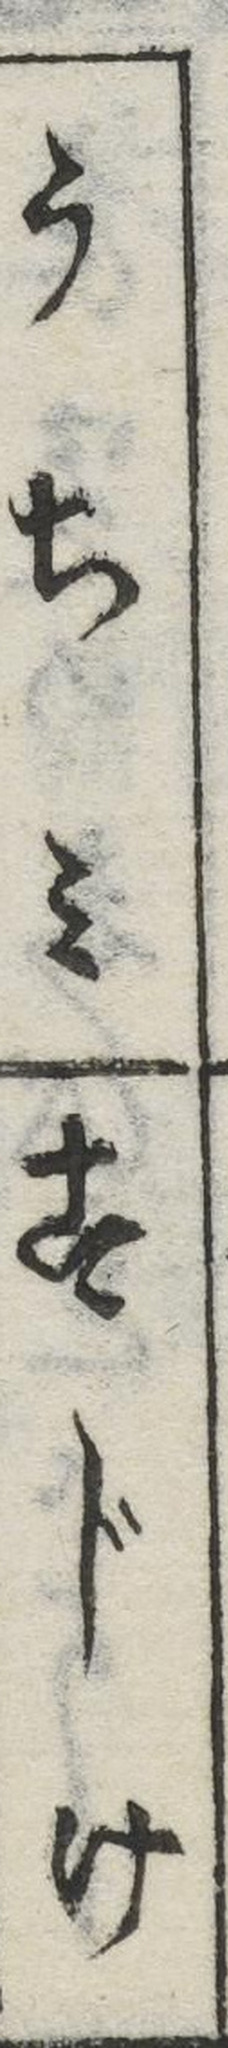うちみすじけ
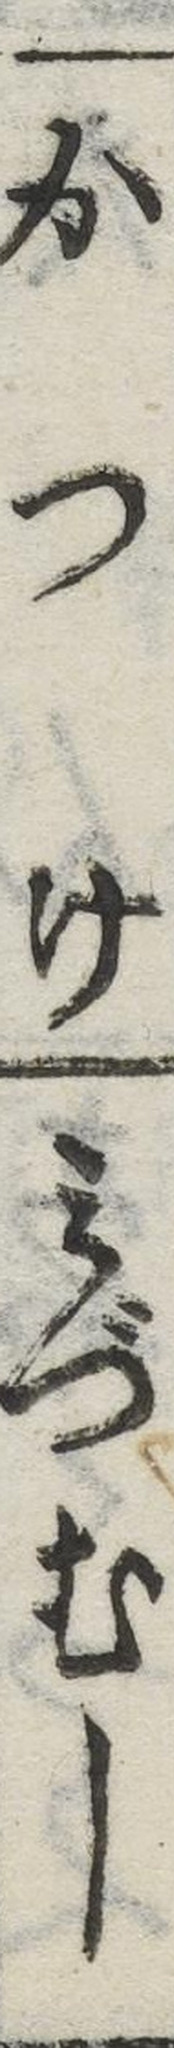かつけみづむし
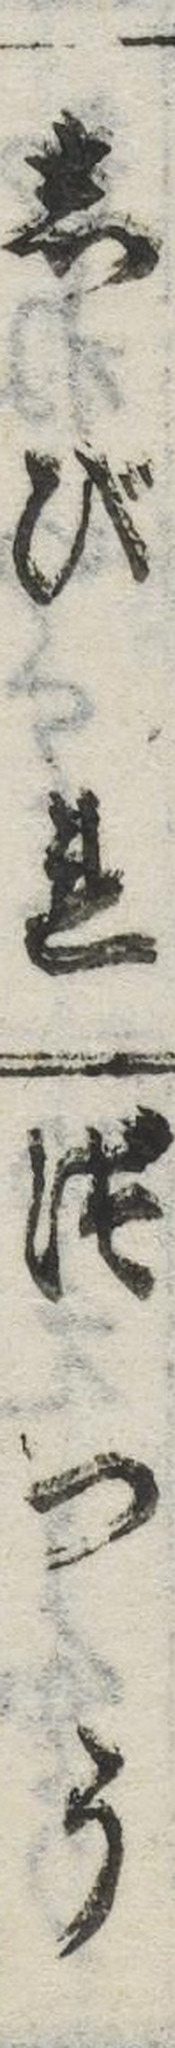しびれづつう
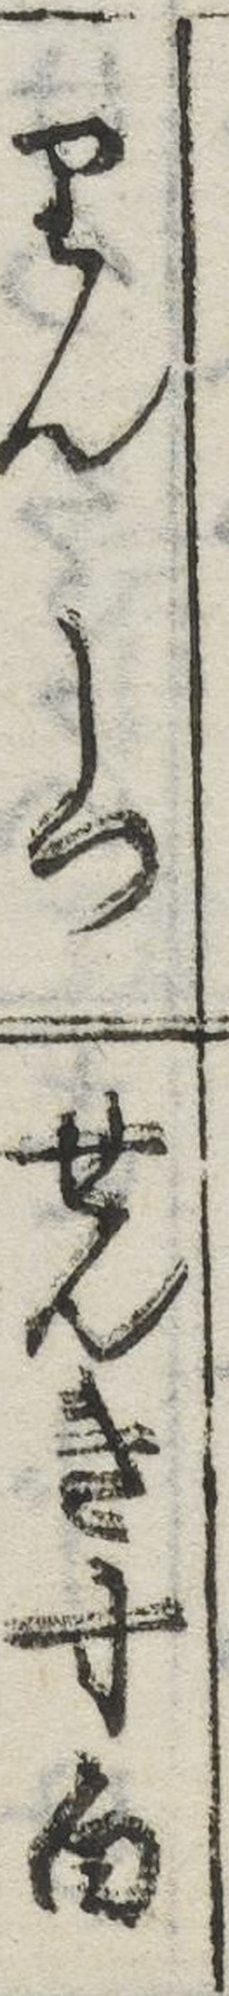りんしつせんき寸白
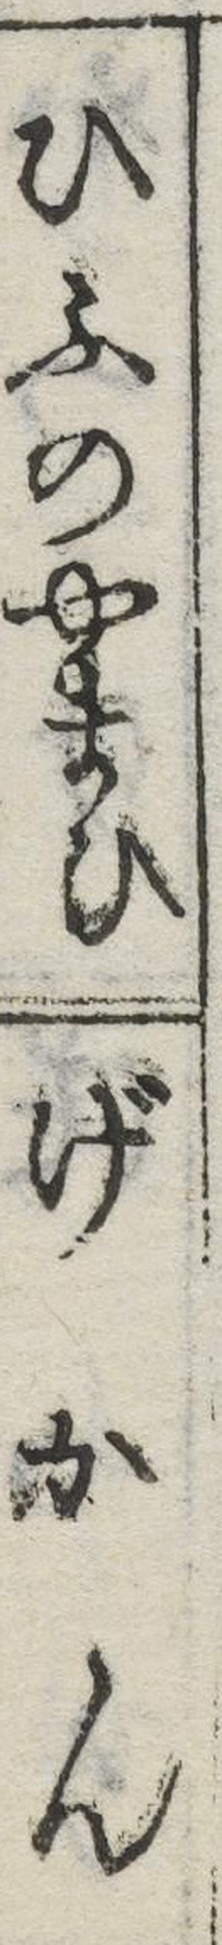ひふのやまひげかん
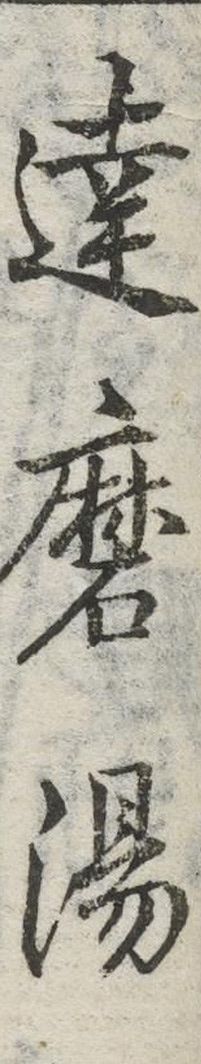達磨湯
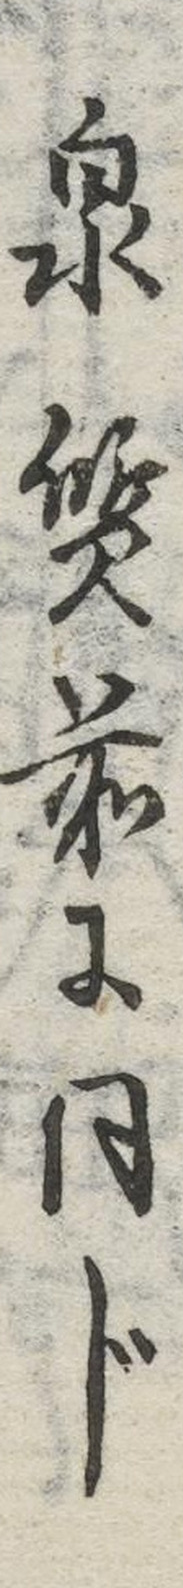泉質前に同じ
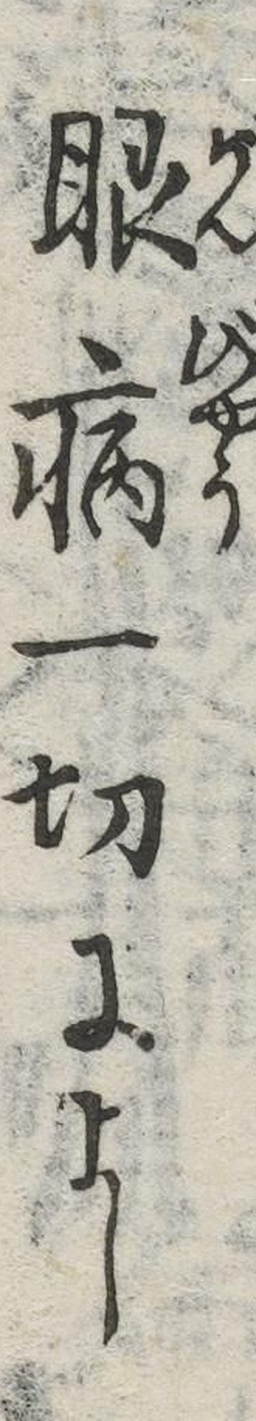眼病一切によし
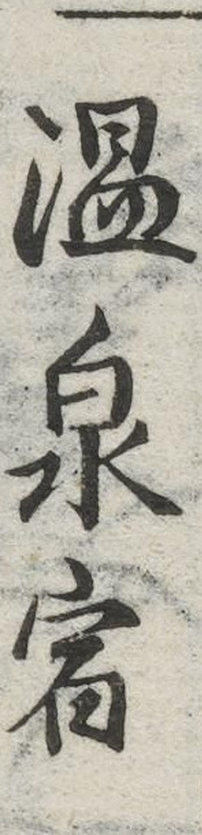温泉宿
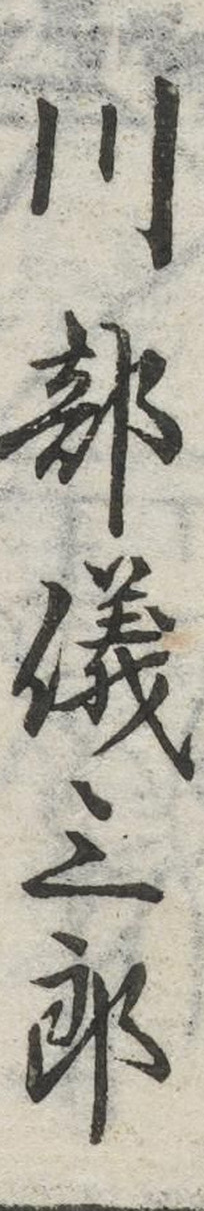川部儀三郎
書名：諸國温泉遊覽記　全
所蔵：東京大学地震研究所図書室 Earthquake Research Institute Library, The University of Tokyo, JAPAN
